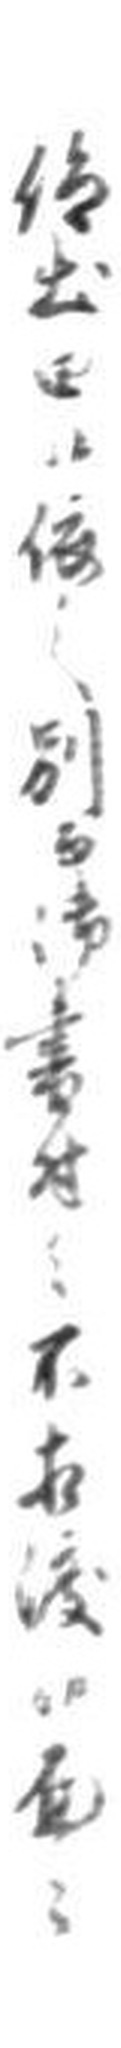仰出由候依之別而御書付者不相渡候面々
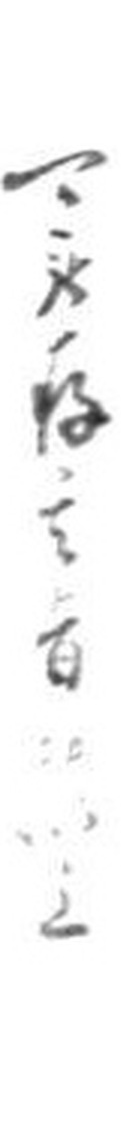可被存其旨候以上
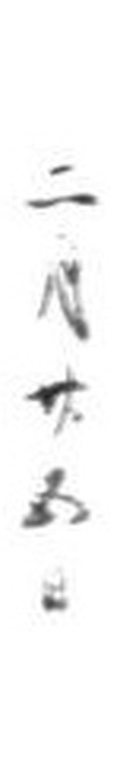二月廿五日

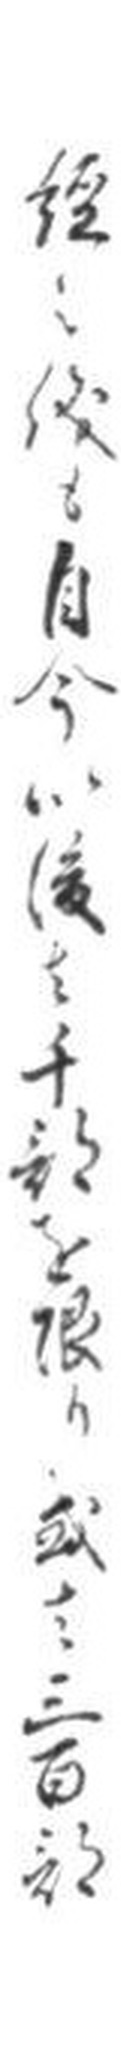経之儀も自今以後者千部を限り或者三百部
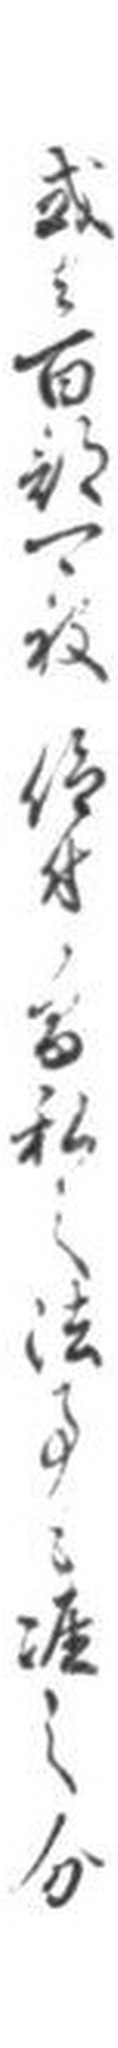或者百部可被仰付候間私之法事も准之分
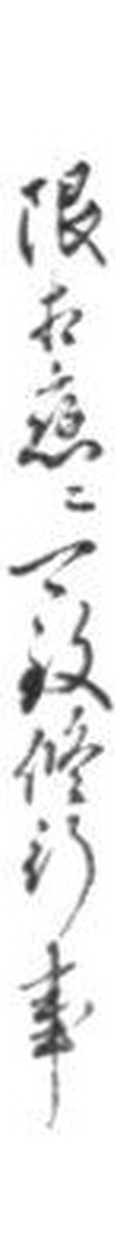限相応ニ可致修行事
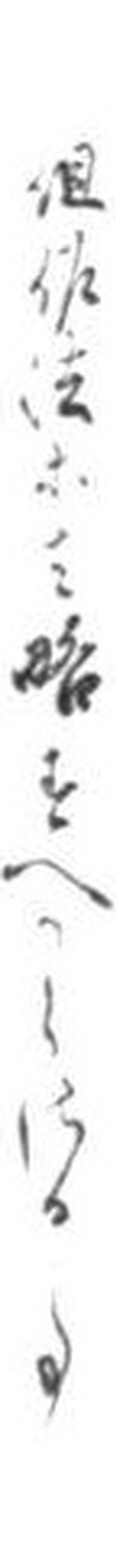但作法等者略すへからさる事
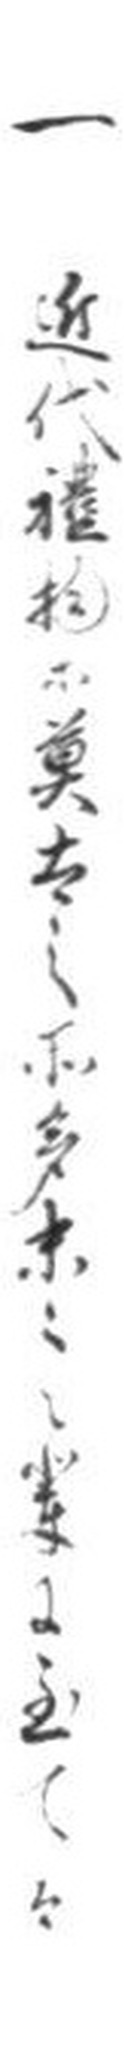一近代礼物等莫太之所多末々之輩に至ては
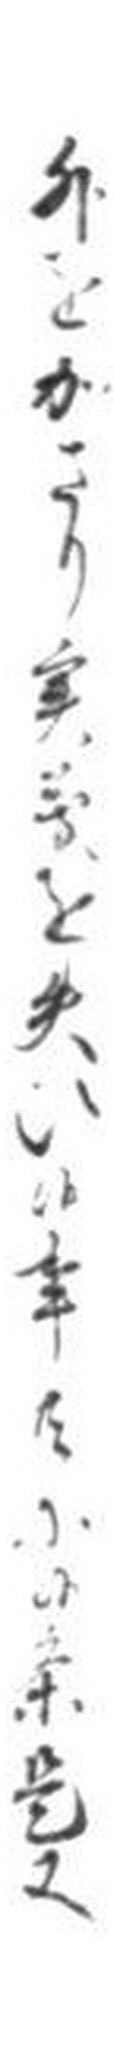外をかさり実義を失ひ候事共に候条是又
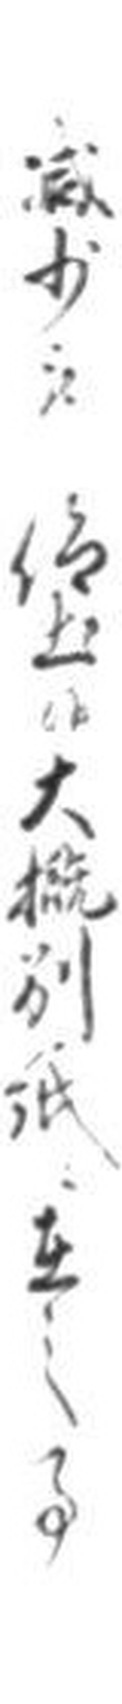減少被仰出候大概別紙ニ在之事
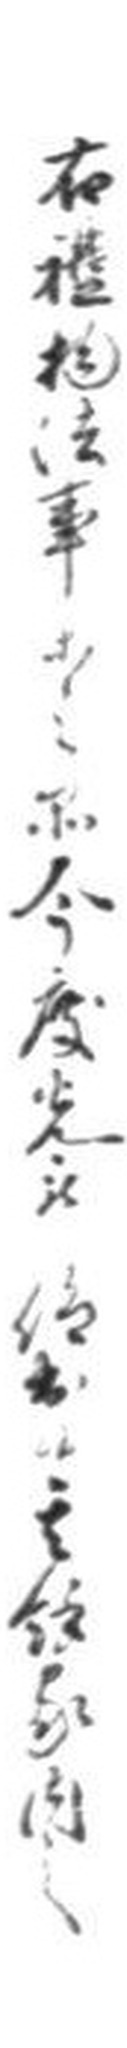右礼物法事等之品今度先被仰出候其余家内之
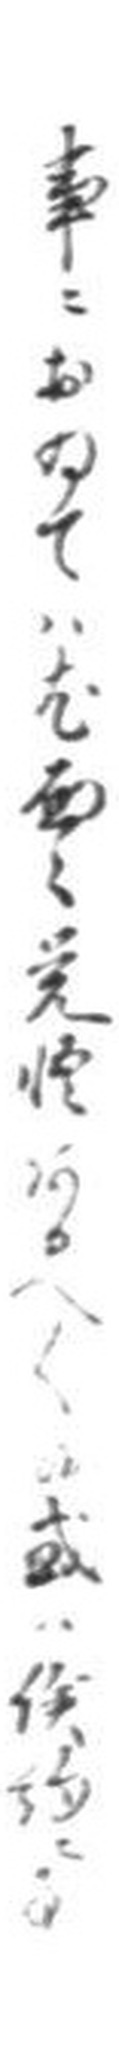事ニおゐてハ尤面々覚悟あるへく候或ハ倹約ニ事
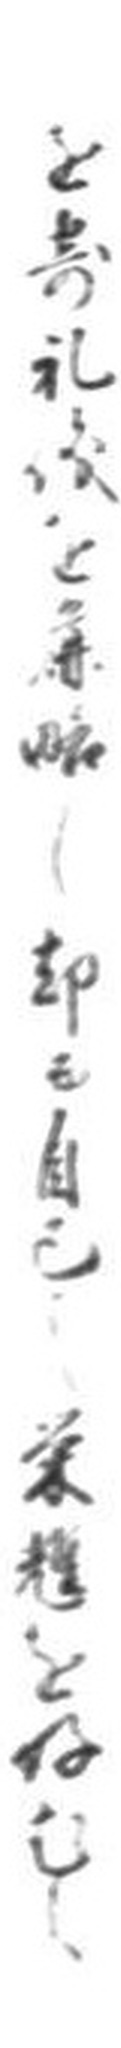を寄礼儀を麁略し却而自己之栄耀を好む之
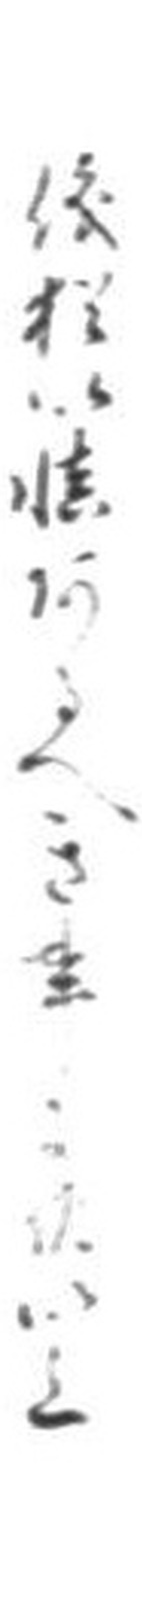儀猶以慎あるへき事に候以上
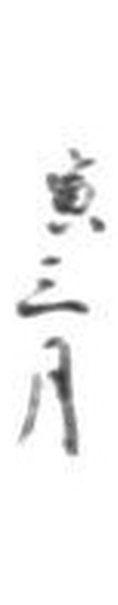寅三月
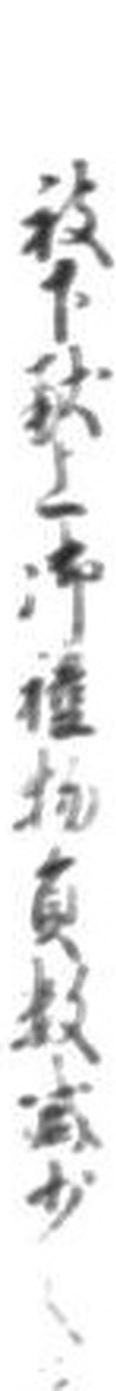被下献上御礼物員数減少之覚大概
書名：家譜 三十五 宗昌公 従享保六年到同七年
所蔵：福井県文書館 Fukui Prefectural Archives
